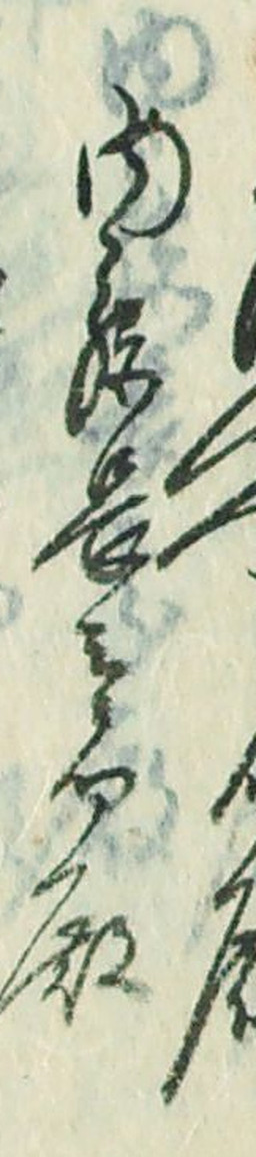内藤長三郎殿
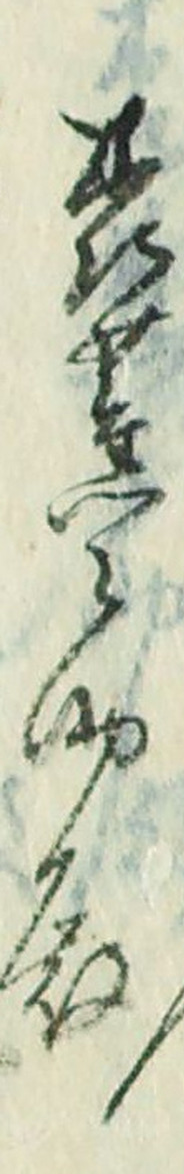森薫之助殿
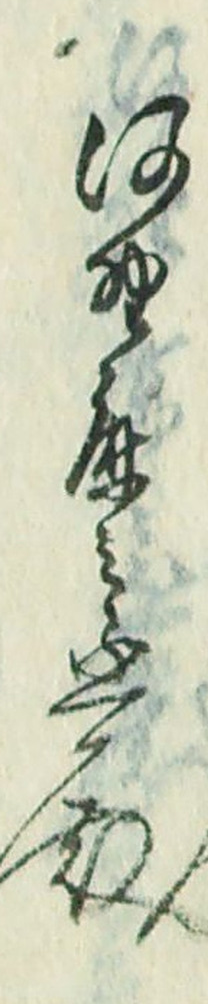河野鹿之丞殿

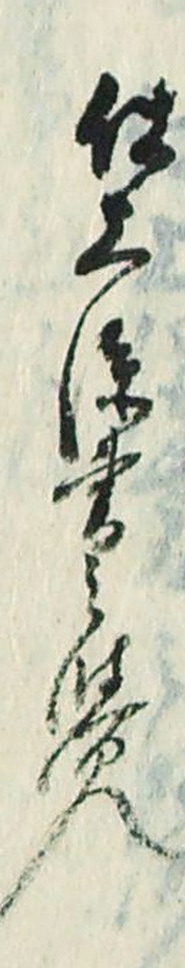仕上添書之覚
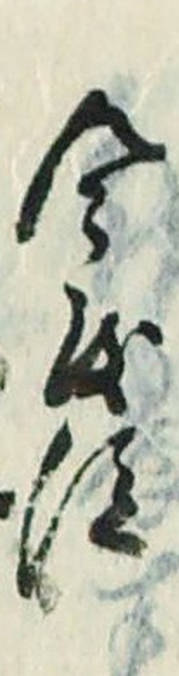今度従
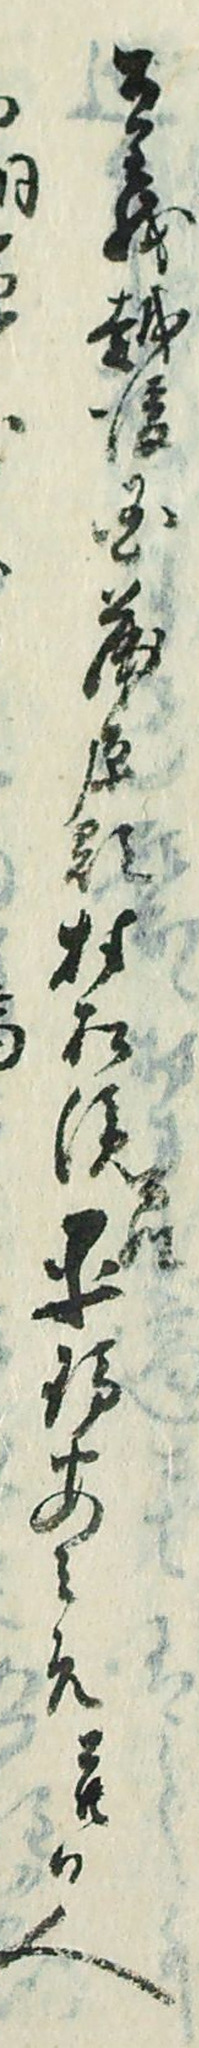公義越後国蒲原郡村松浜百姓平野安兵衛幷同人
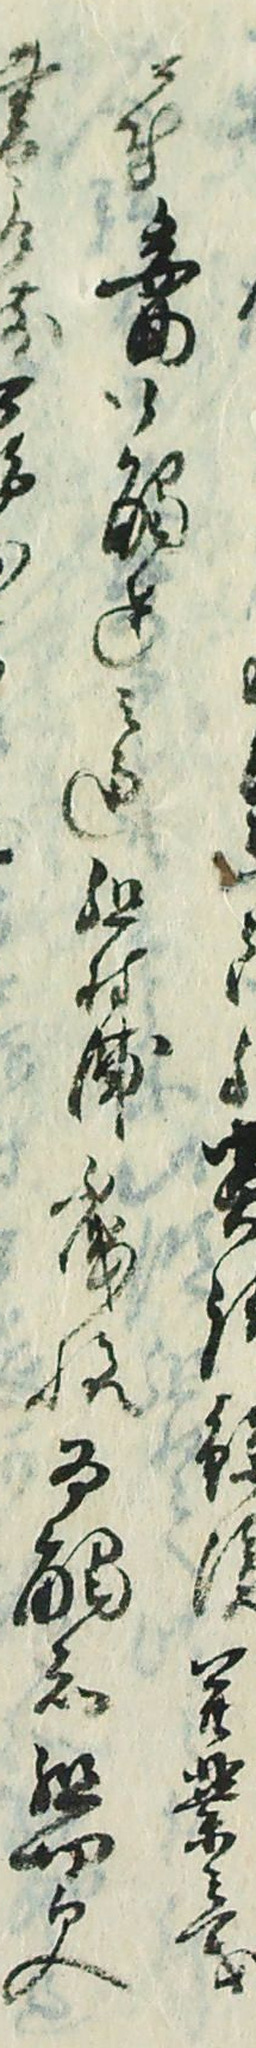に付委曲御触達之通組村浦不洩様為触知組切受
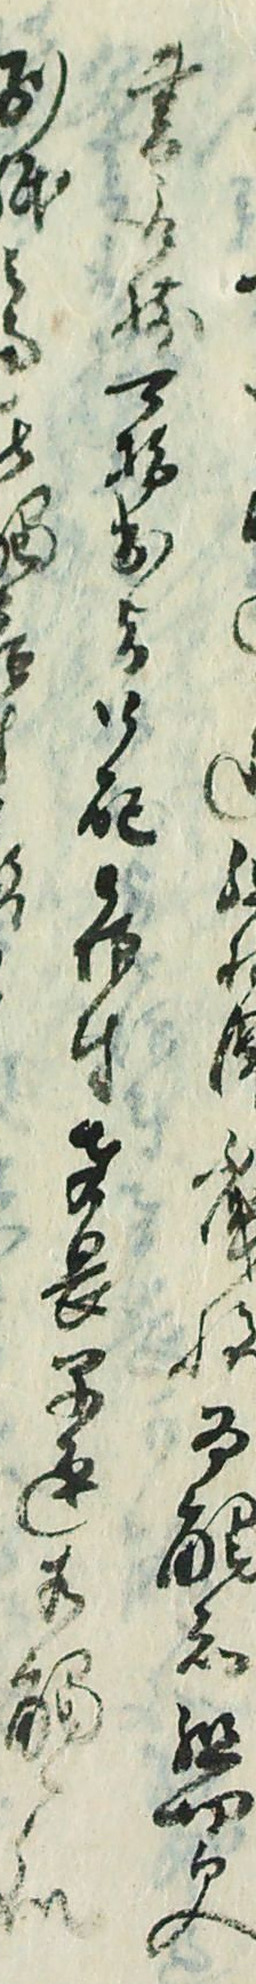書取揃可指出旨御触被仰付奉畏早速相触候処
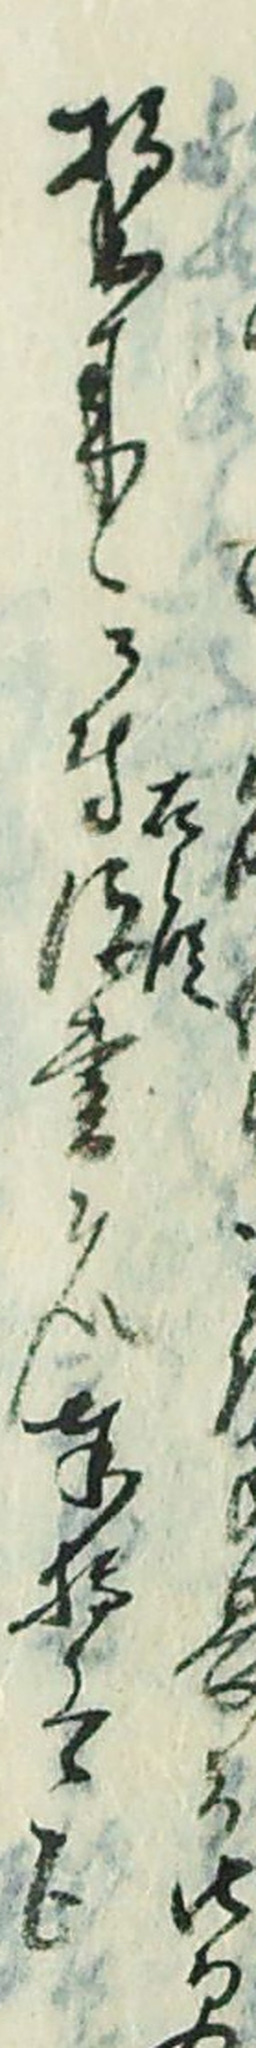指出来候に付右之段添書を以奉指上候以上
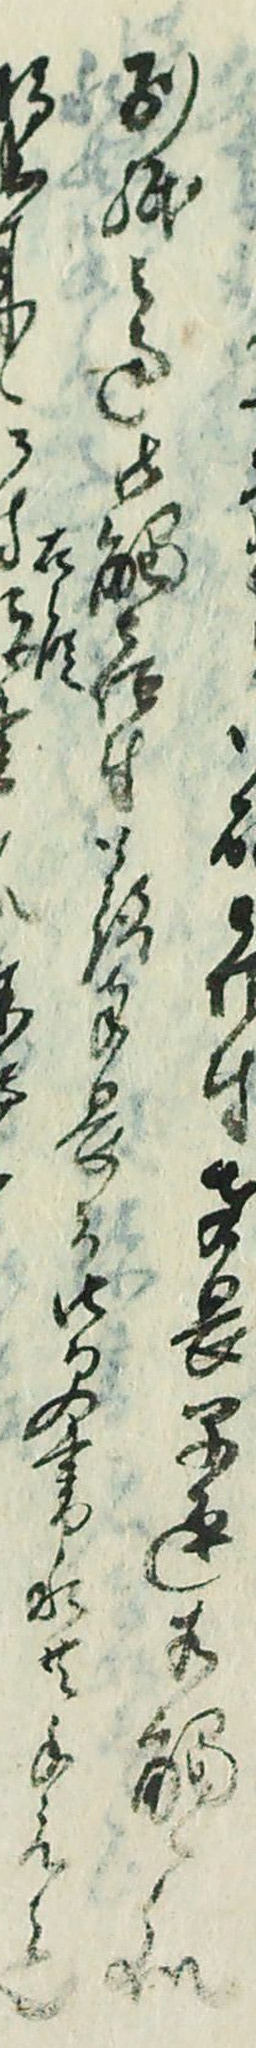別紙之通御触被仰付御趣奉畏旨御受書私共手元迄
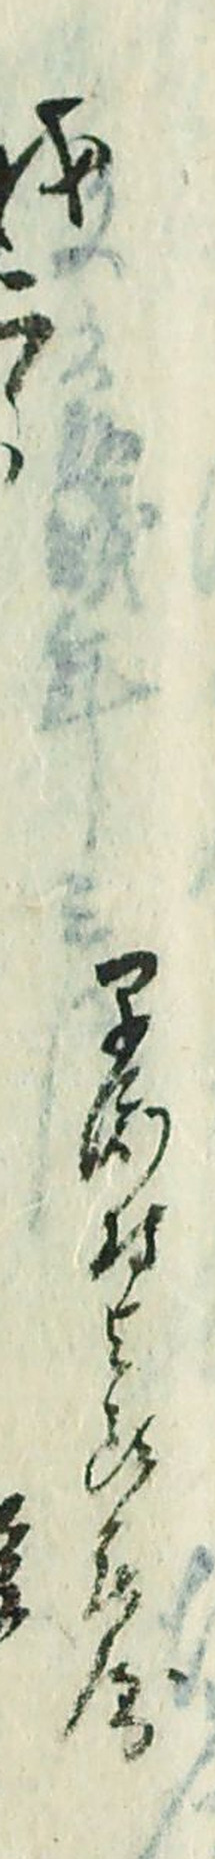早渕村与頭庄屋
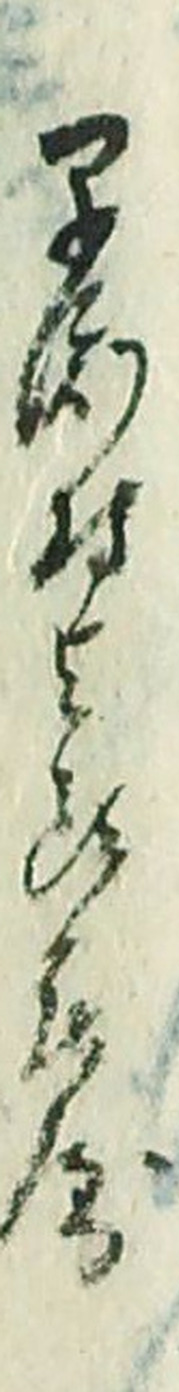早渕村与頭庄屋
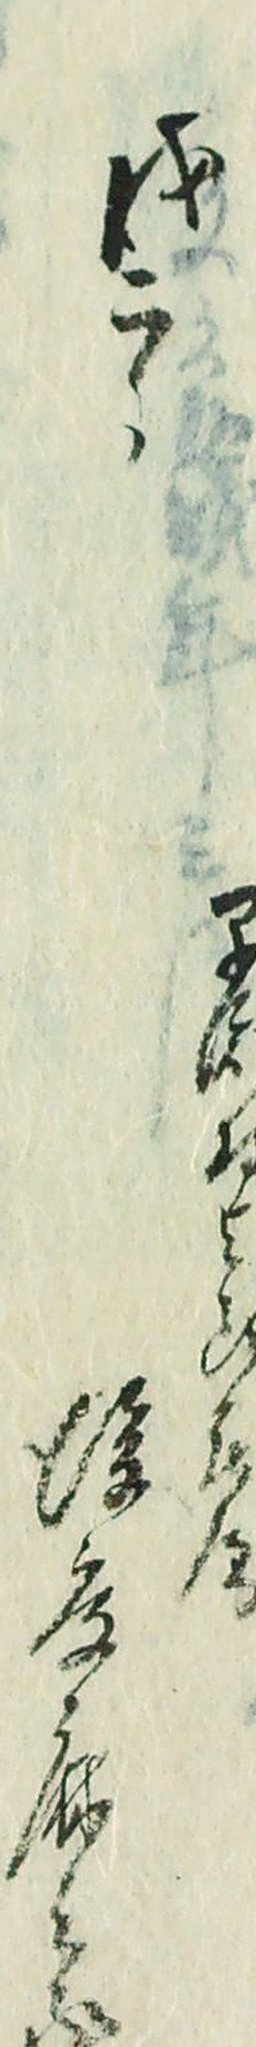戌二月後藤麻之丞
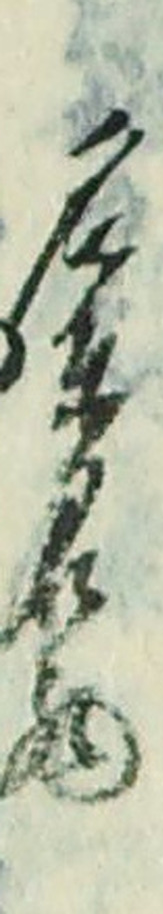名東名西
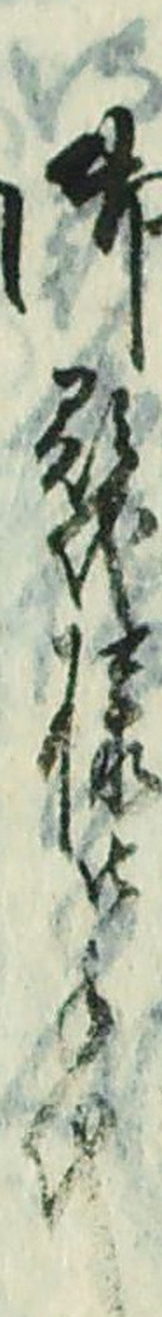御郡代様御手代
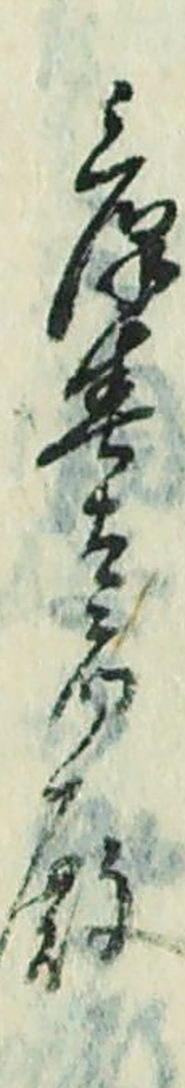三沢春太郎殿
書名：諸御用御□受書控
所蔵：鳴門教育大学 Naruto University of Education
